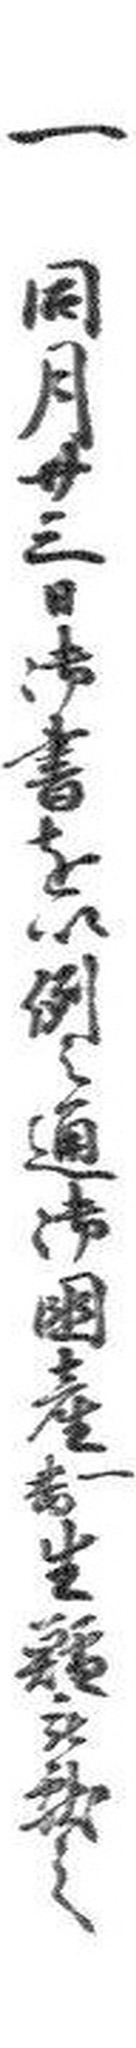一同月廿三日御書を以例之通御国産一番生鱈被献之
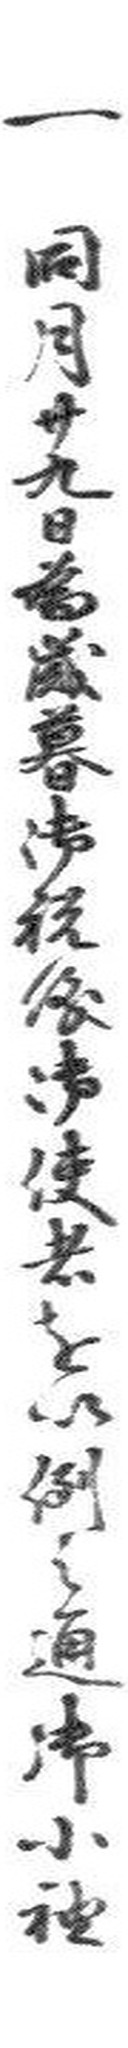一同月廿九日為歳暮御祝儀御使者を以例之通御小袖
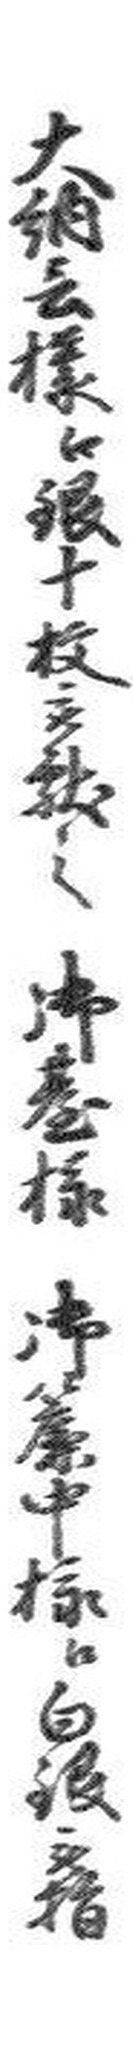大納言様江銀十枚被献之御台様御簾中様江白銀被指

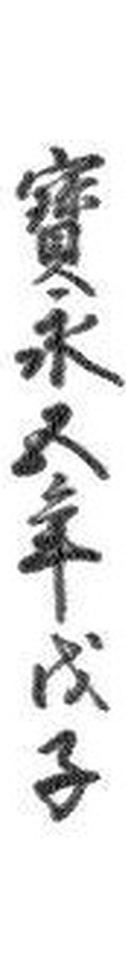宝永五年戊子
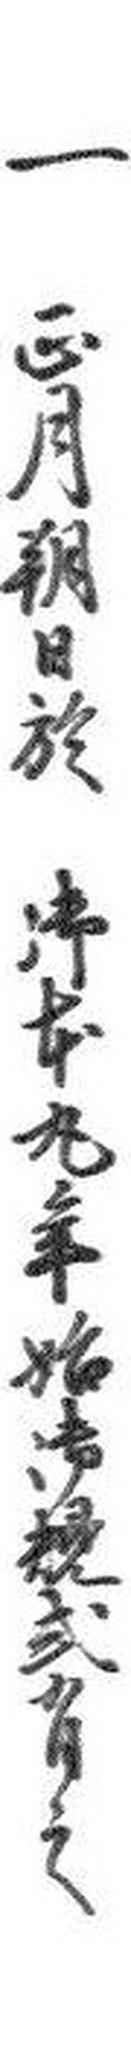一正月朔日於御本丸年始御規式有之
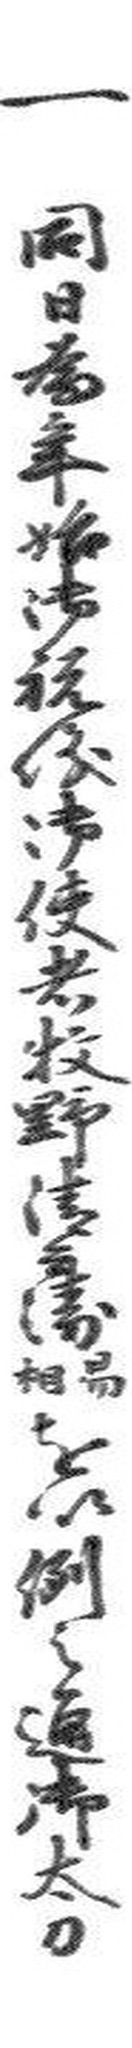一同日為年始御祝儀御使者牧野清兵衛易相を以ｒ例之通御太刀
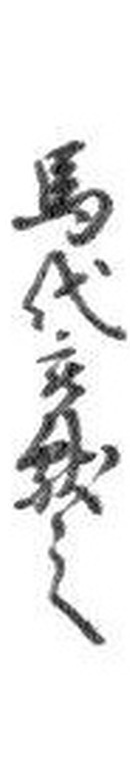馬代被献之
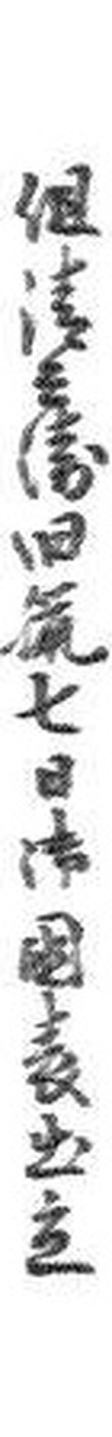但清兵衛旧臘七日御国表出立
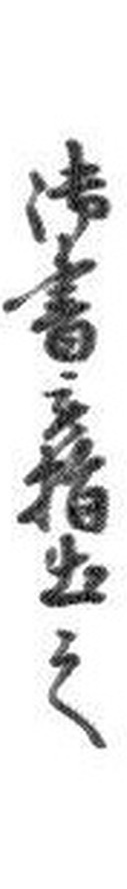御書被指出之

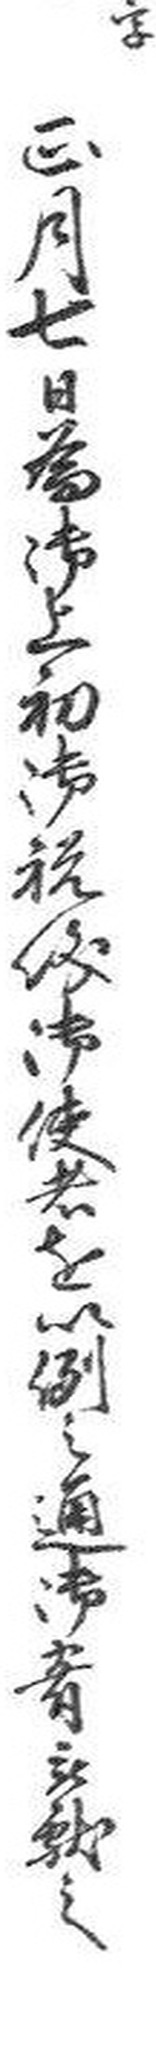正月七日為御上初御祝儀御使者を以例之通御肴被献之
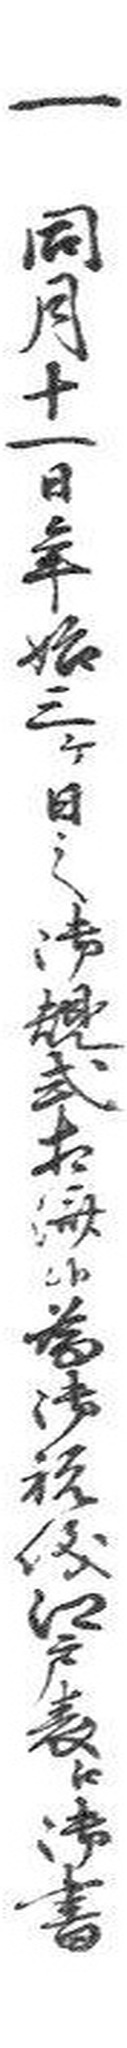一同月十一日年始三ヶ日之御規式相済候為御祝儀江戸表江御書
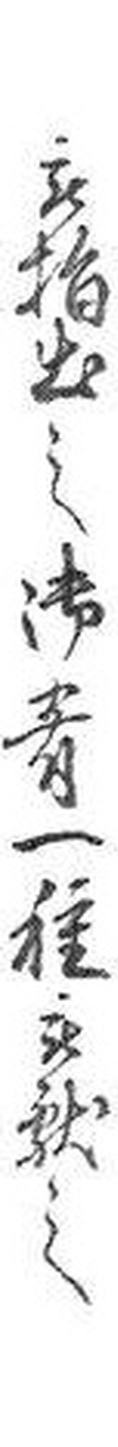被指出之御肴一種被献之
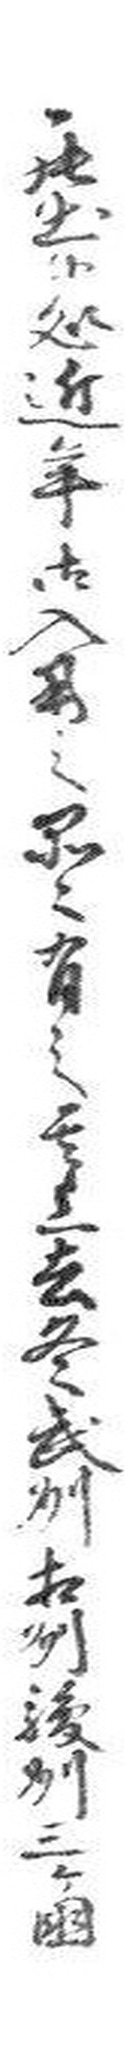罷出候処近年御入用之品々有之其上去冬武州相州駿州三ヶ国
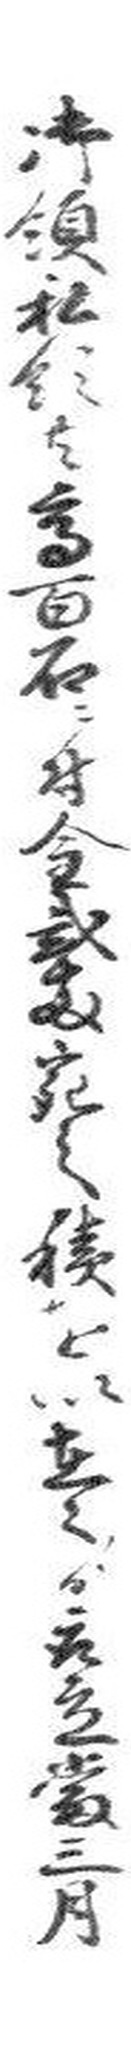御領私領共高百石二付金弐両宛之積を以在々ゟ取立当三月
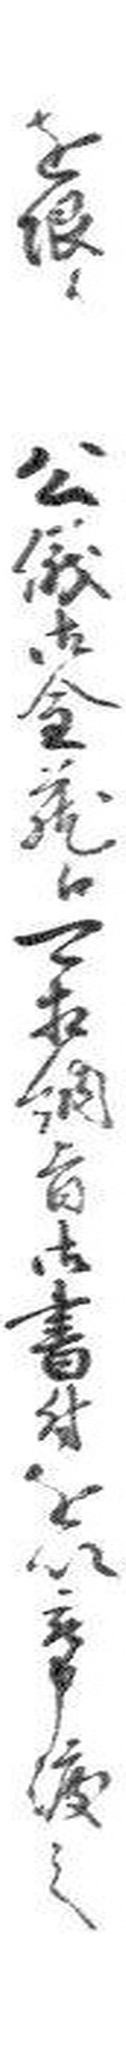を限ニ公儀御金蔵江可相納旨御書付を以被申渡之
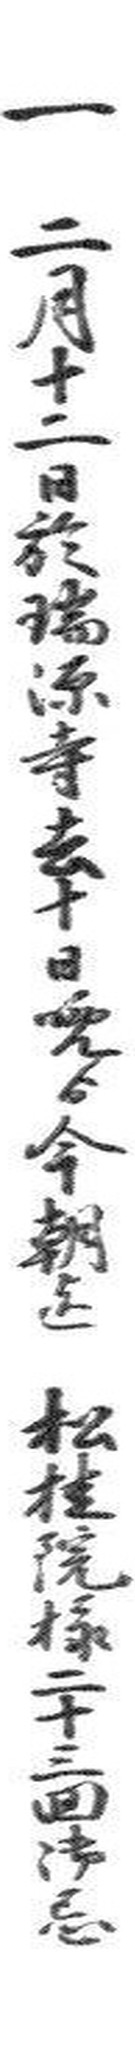一二月十二日於瑞源寺去十日晩ゟ今朝迄松桂院様二十三回御忌
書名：家譜 二十四 吉品公 従宝永三年到同五年
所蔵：福井県文書館 Fukui Prefectural Archives
